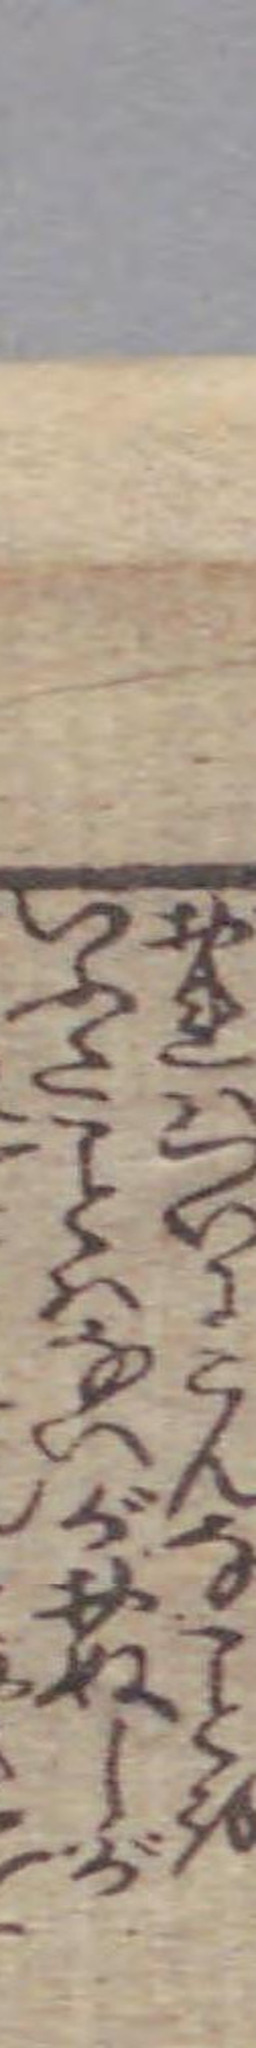いふたことはないがおぬしが
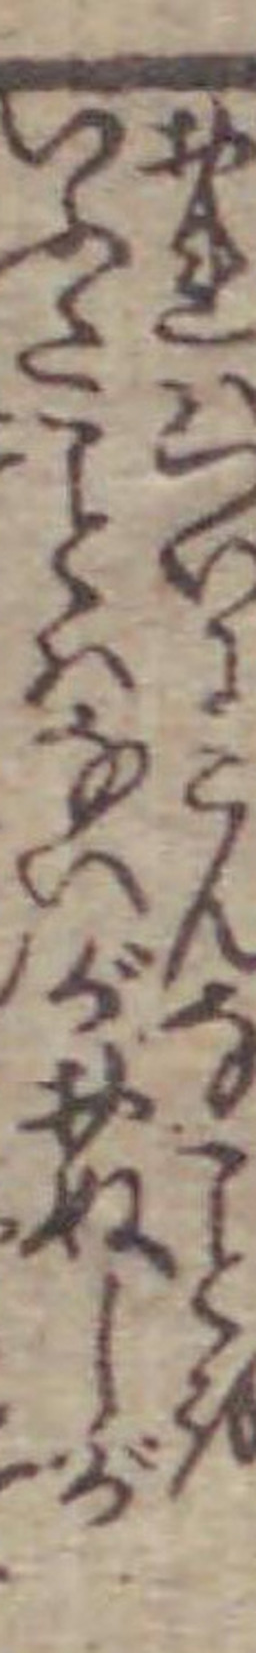いふたことはないがおぬしが
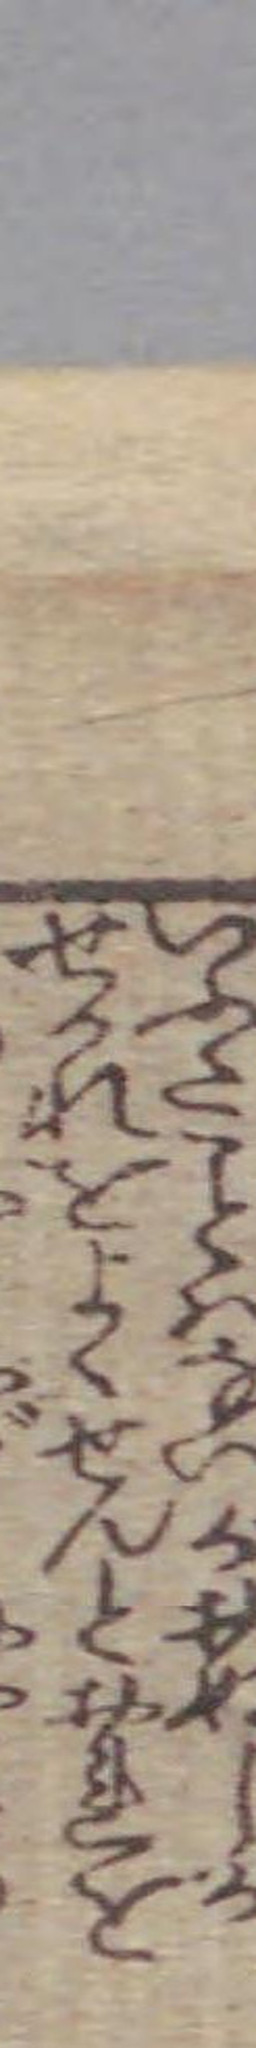せかれをよくせんとおれを
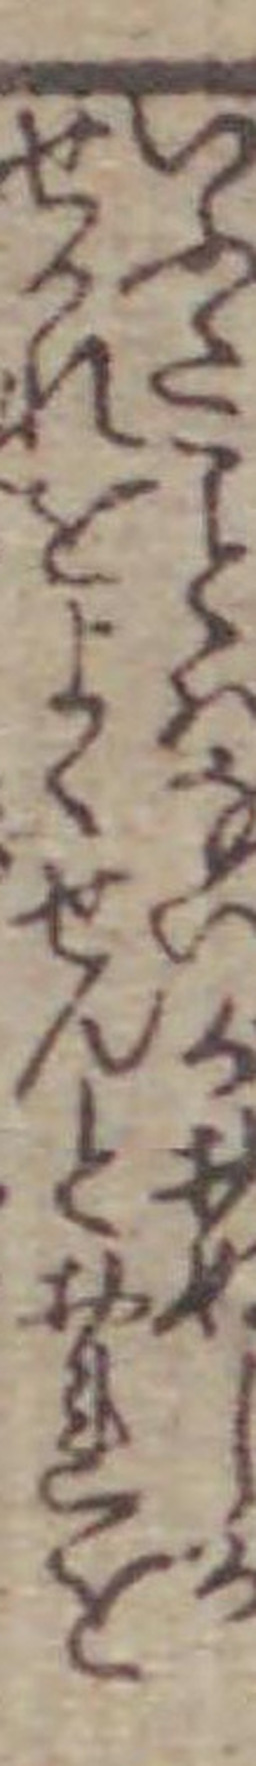せかれをよくせんとおれを
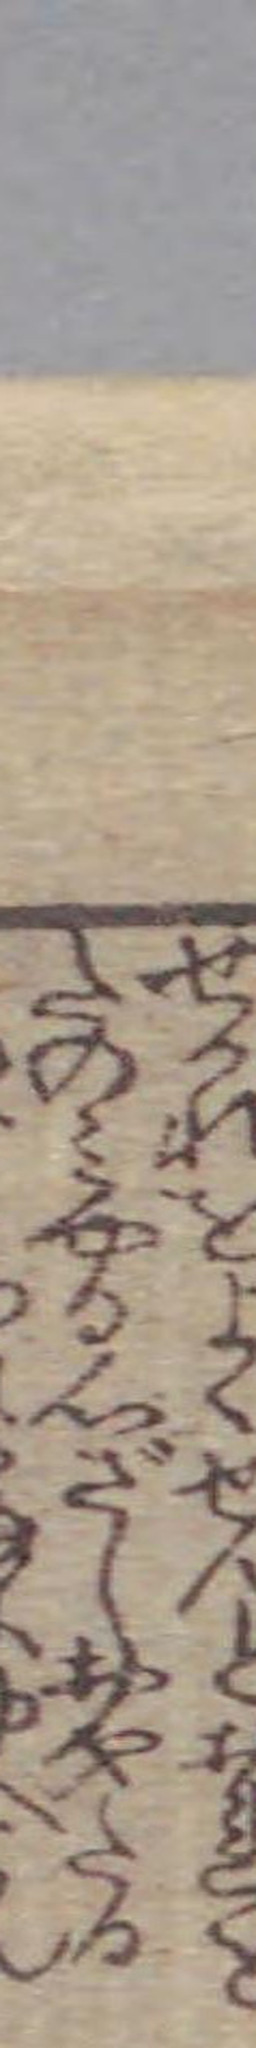たのみやる心ざしおやたる
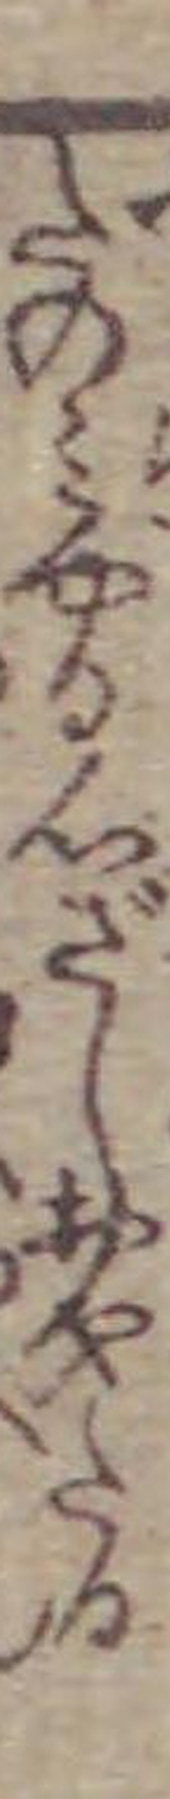たのみやる心ざしおやたる
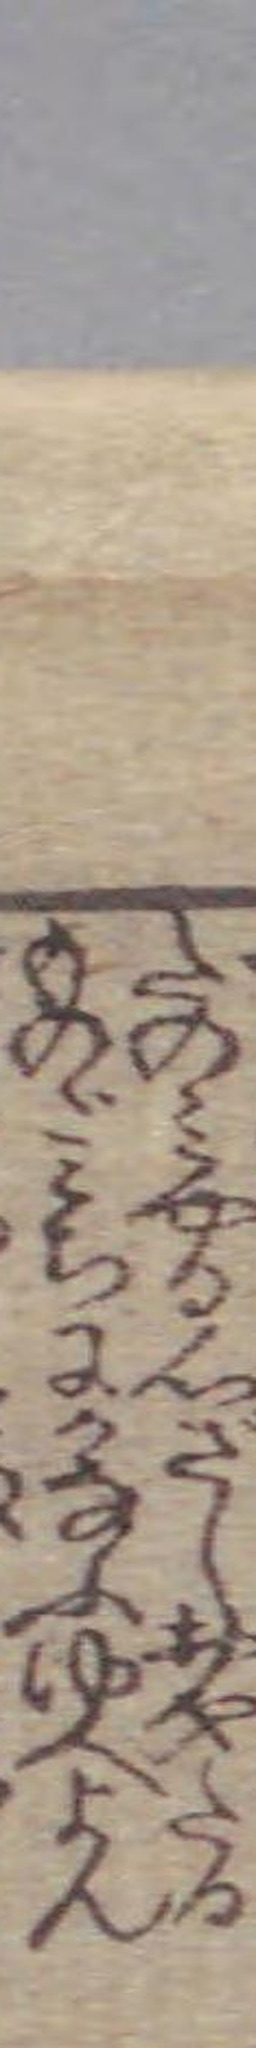ものゝみちにかなふゆへよん
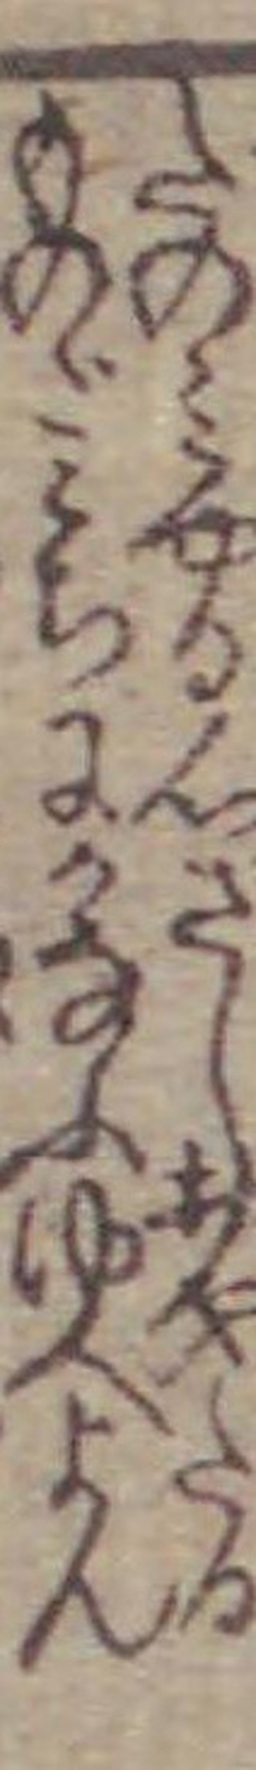ものゝみちにかなふゆへよん
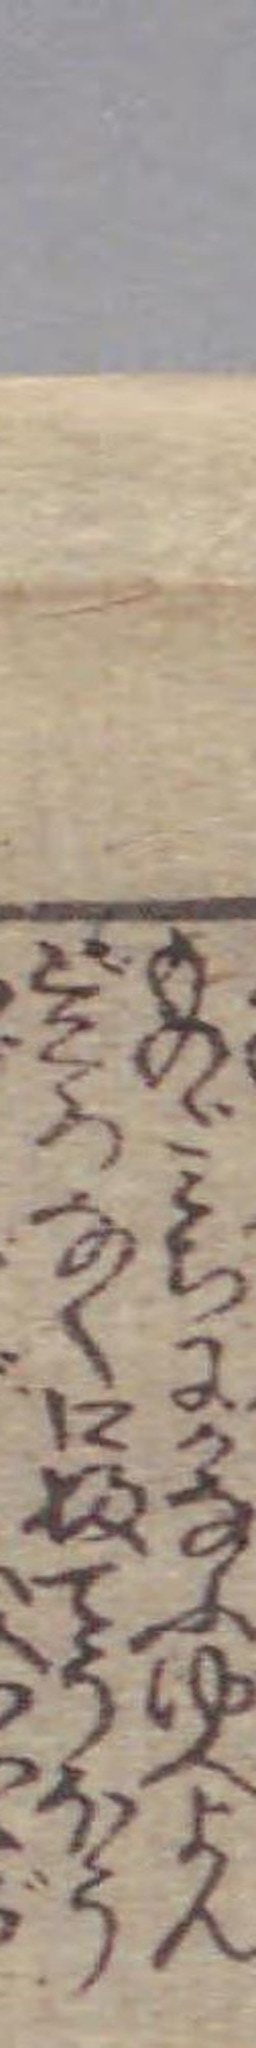どころなく口ふてうほう
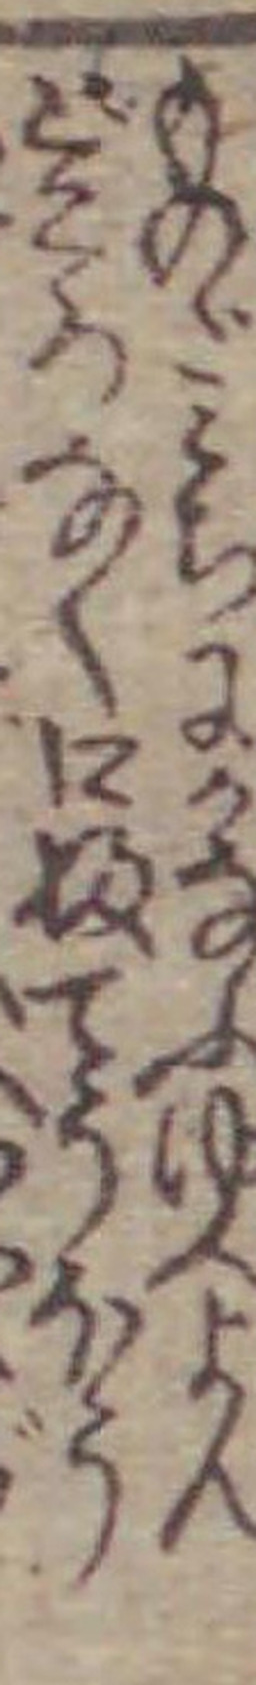どころなく口ふてうほう
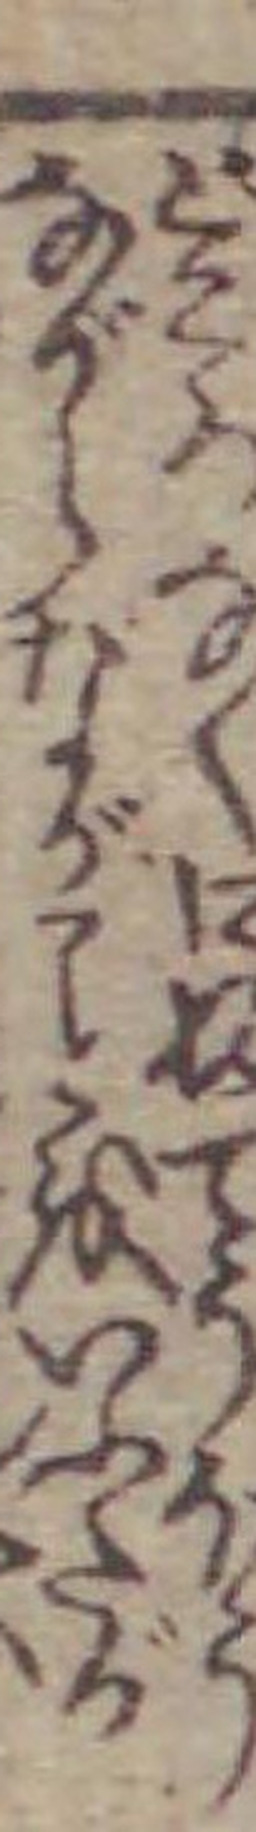ながらながことをいふたが
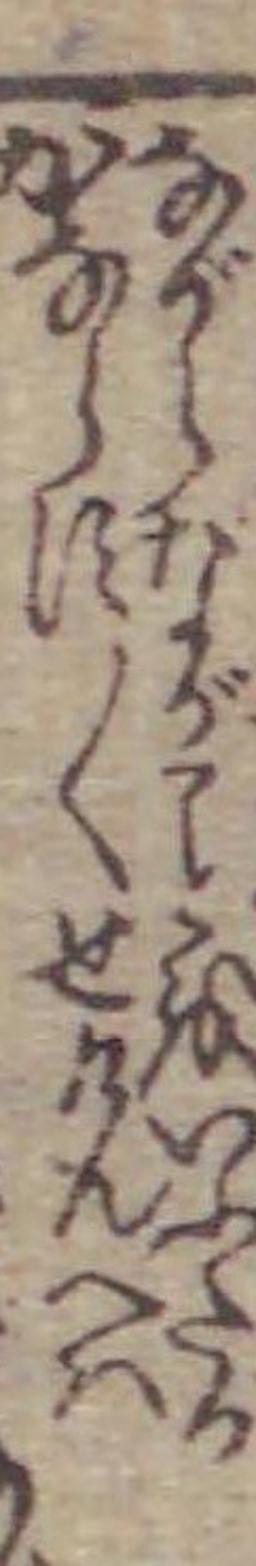かならす〳〵せけんへは

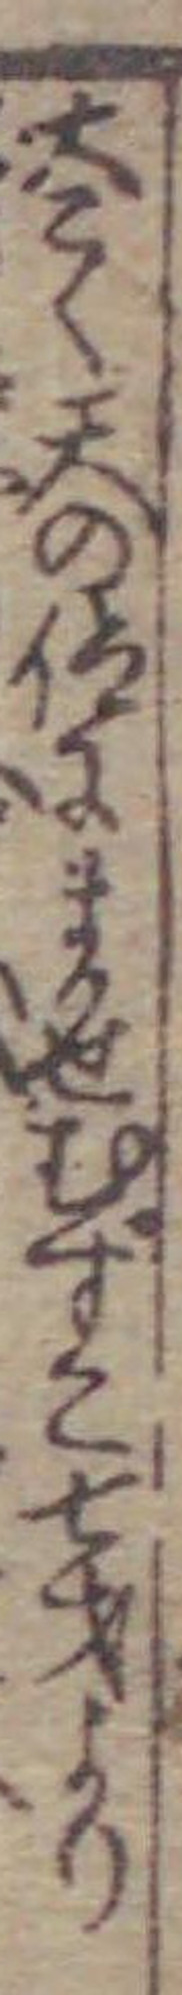大こく天の仰にまかせむすこ七才より
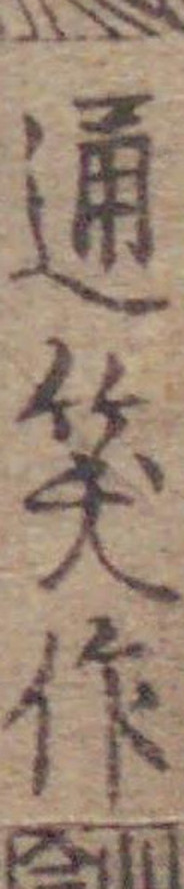通称作
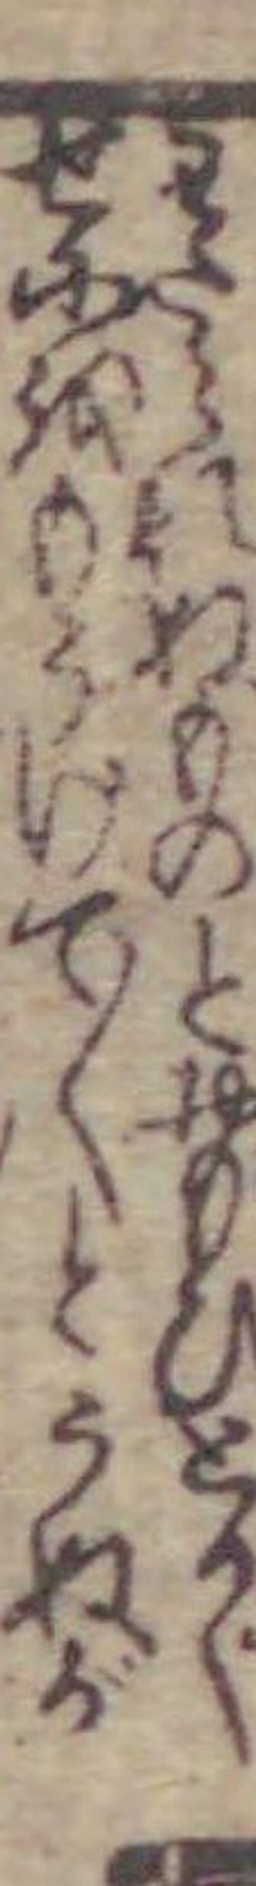せにをもうけて〳〵とうぬが
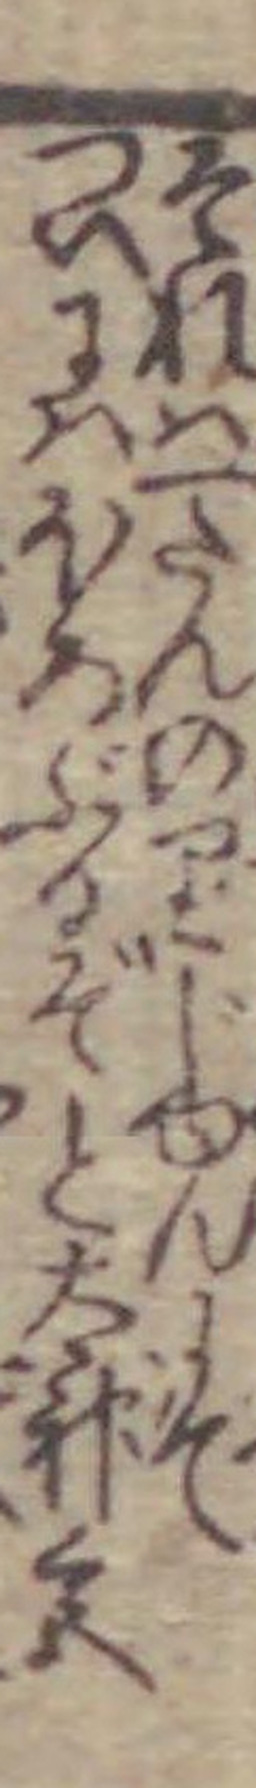ついにはほろぶるぞと大神宮
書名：即席耳学問 : 3巻
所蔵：国立国会図書館 National Diet Library, JAPAN
